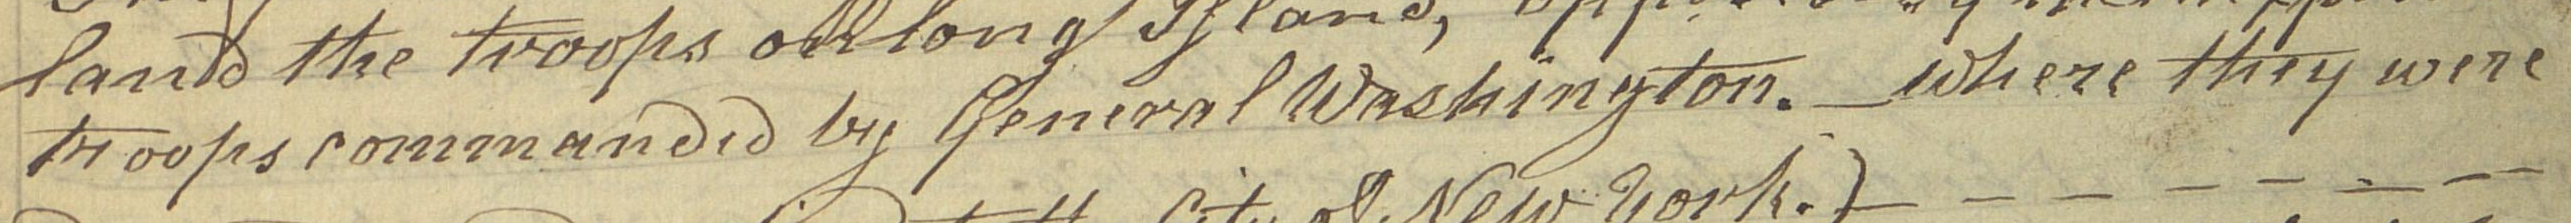troops commanded by General Washington. where they were
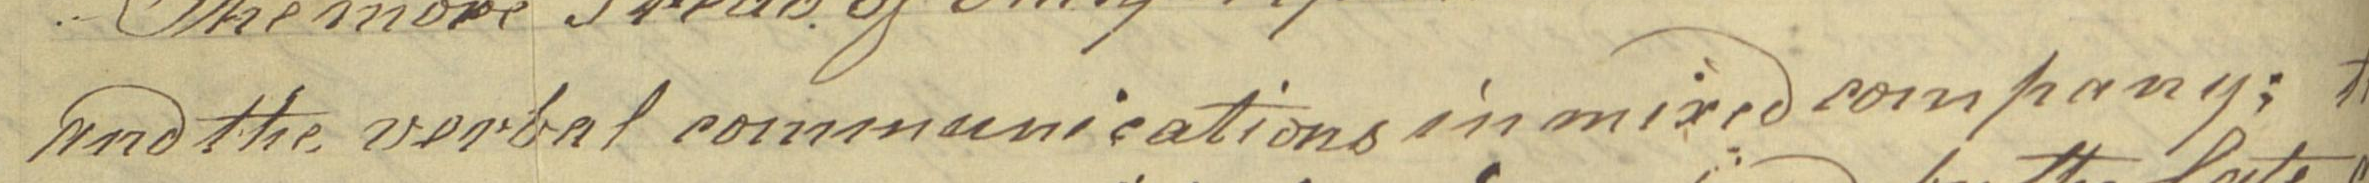and the verbal communications in mixed company;
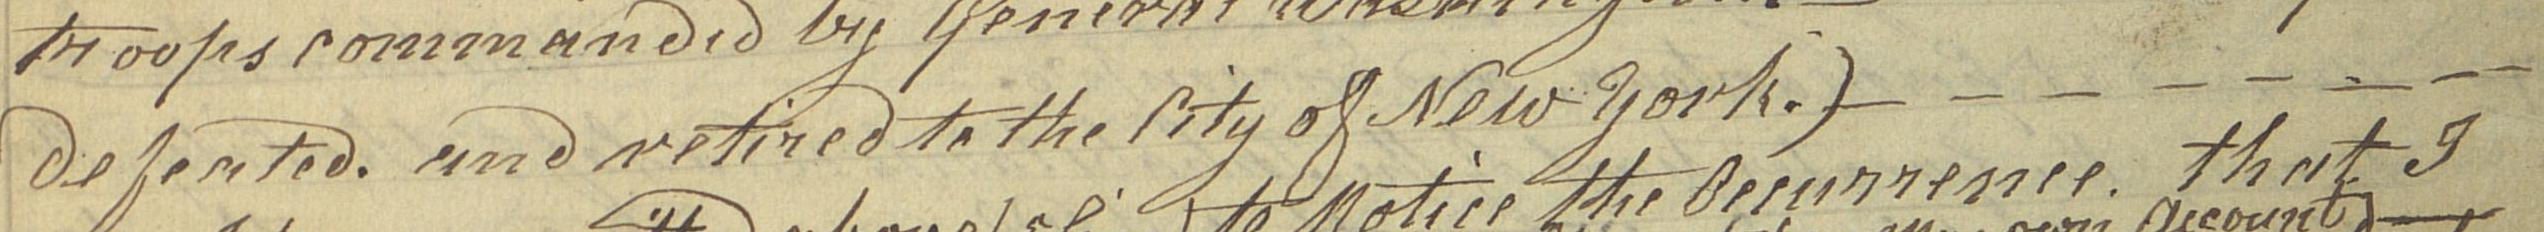defeated. and retired to the City of New York.)
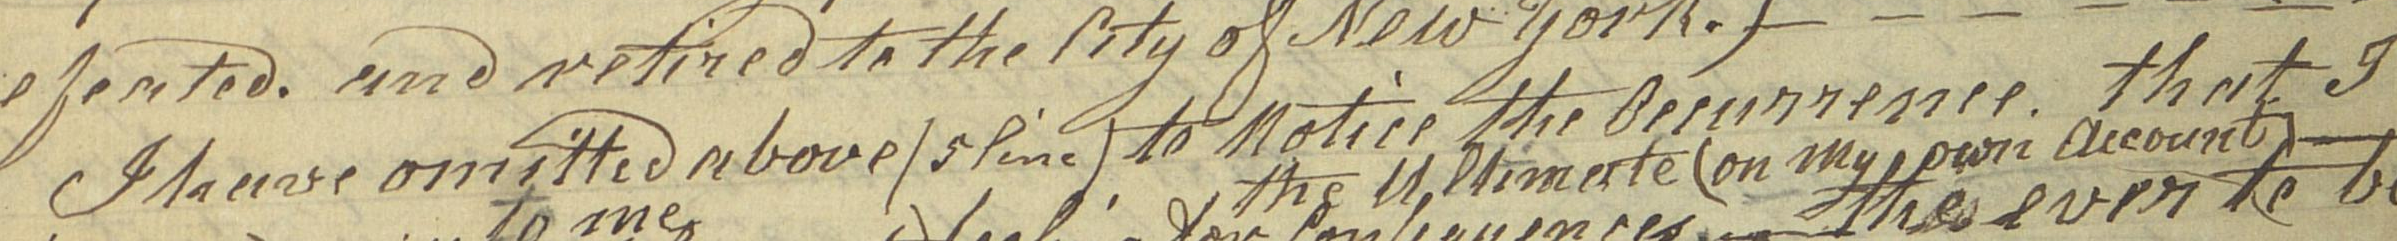I have omitted above (5 line) to Notice the Occurence that I
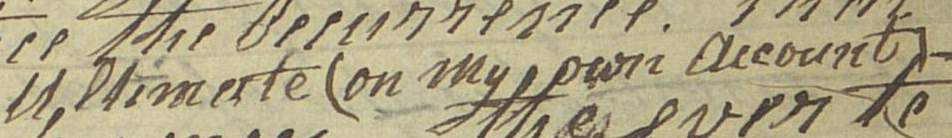Ultimate (on my own account
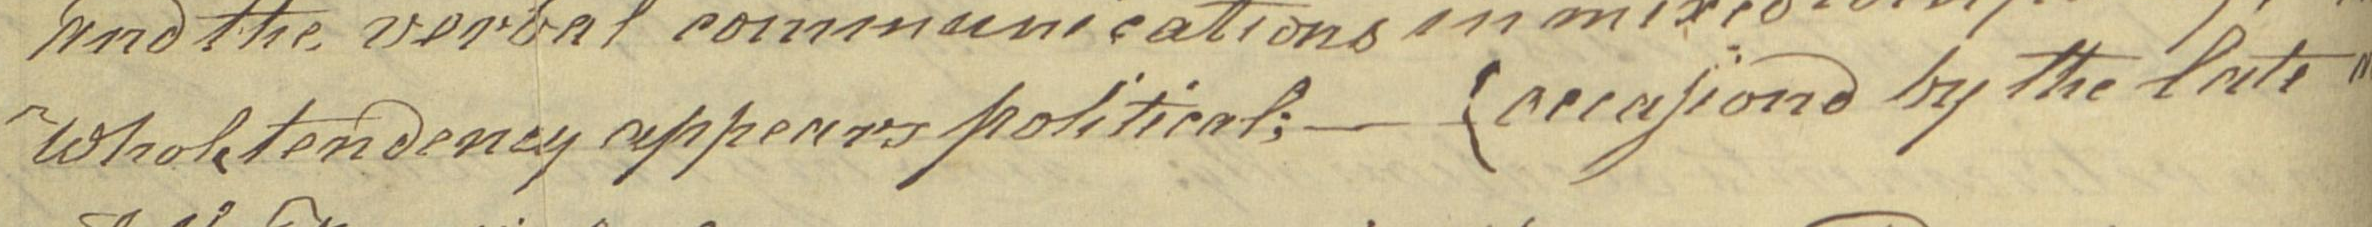whose tendency appears political; (occasiond by the late
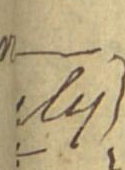-ly
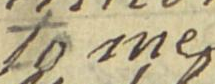to me
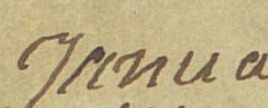Janua
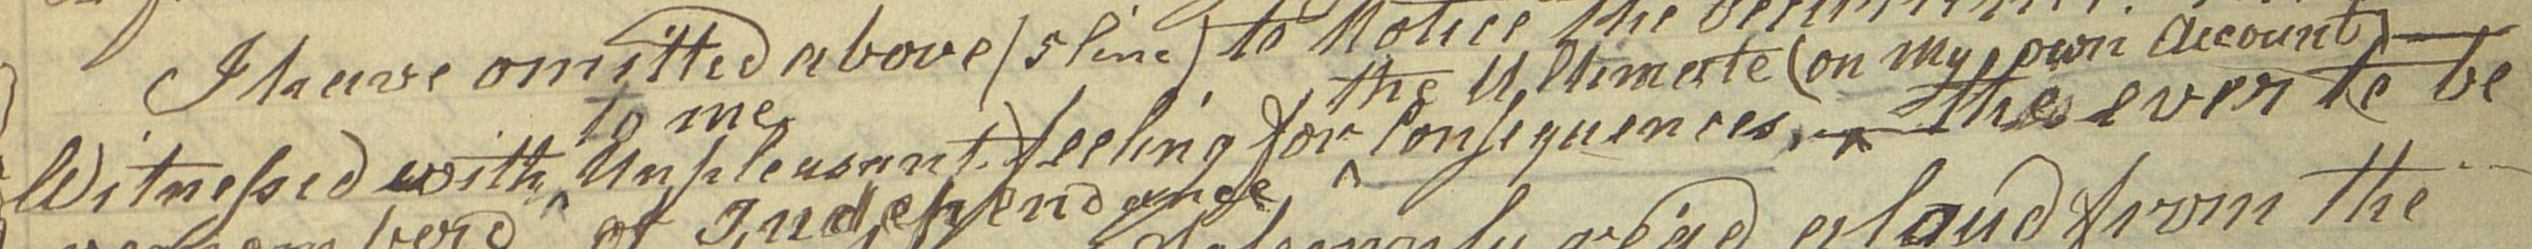Witnessed with ^ unpleasant feeling for ^ Consequences ^ the ever to be
